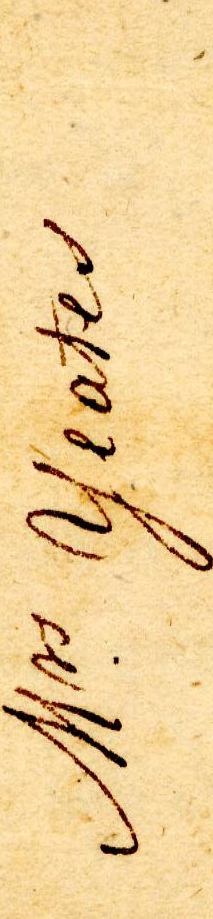M^ms. Yeater
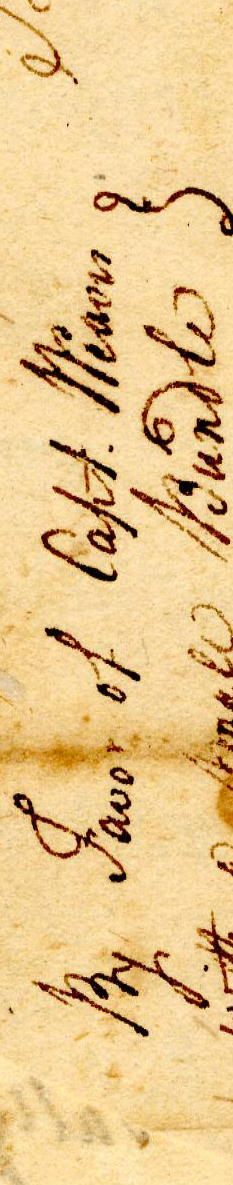By Pavor of Capt. Weaos
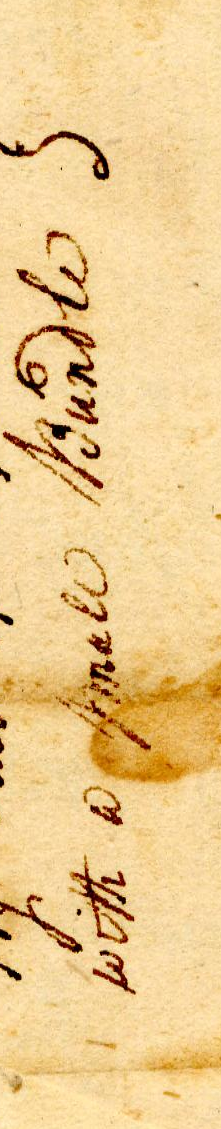with dafnell Bundle
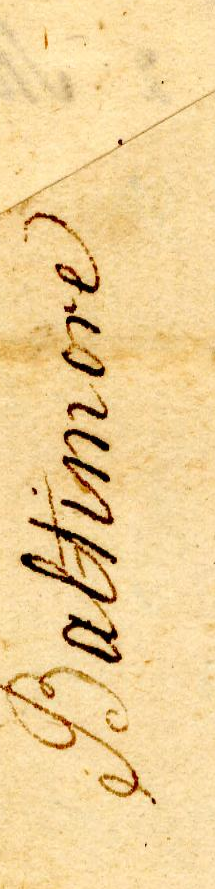saltimore
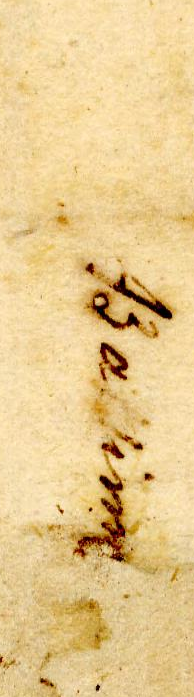B astim
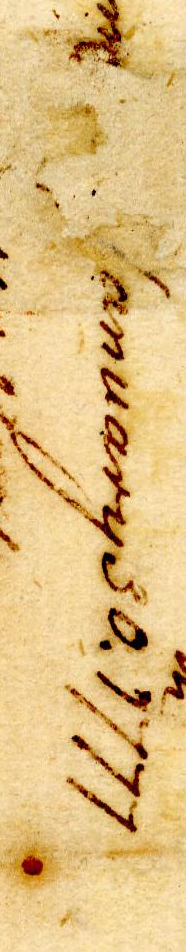anuary 30. 1777
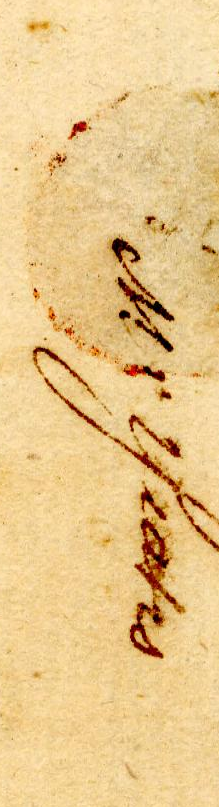W^s Yeates
